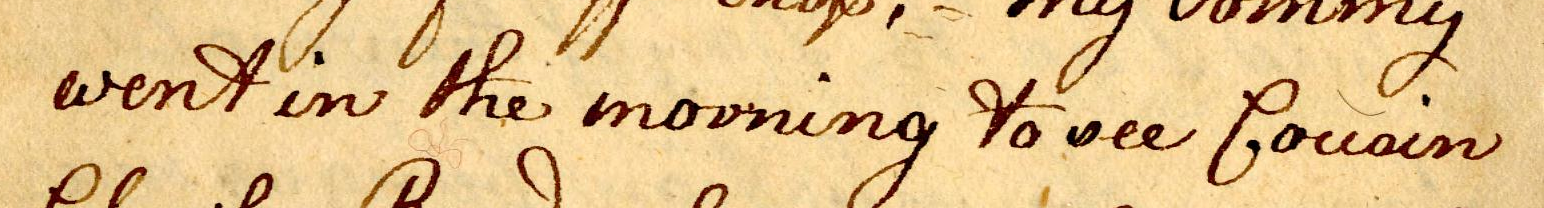went in the morning to see Cousin
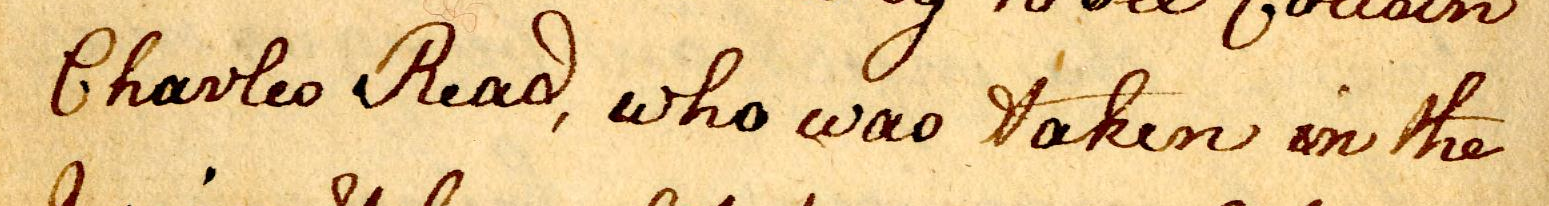Charles Read, who was taken in the
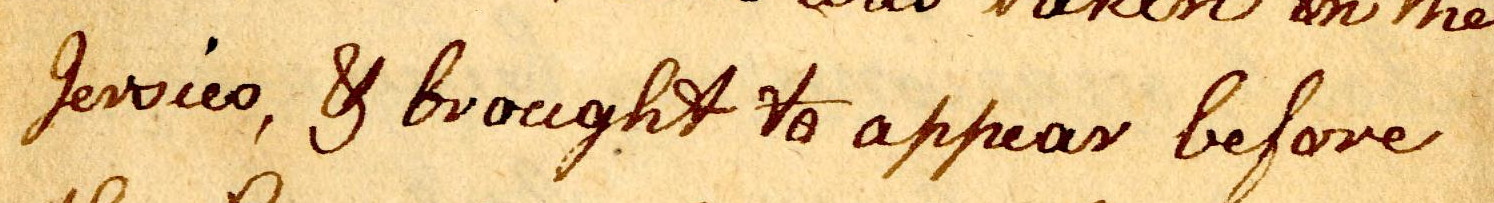Jersies, & brought to appear before
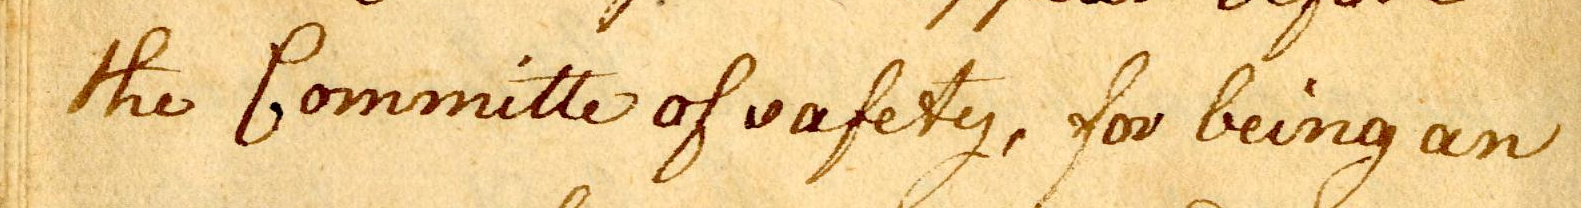the Committee of safety, for being an
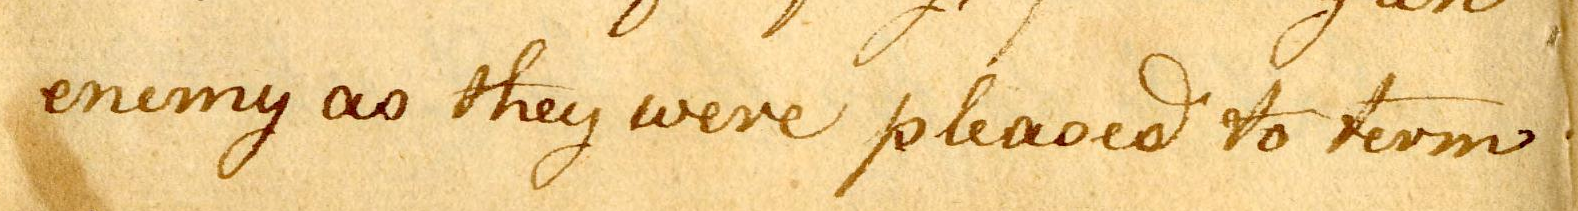enemy as they were pleased to term
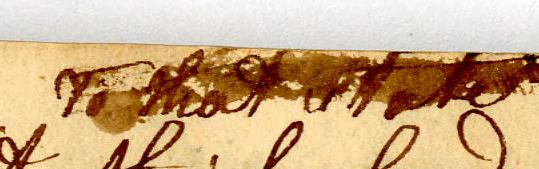To that state
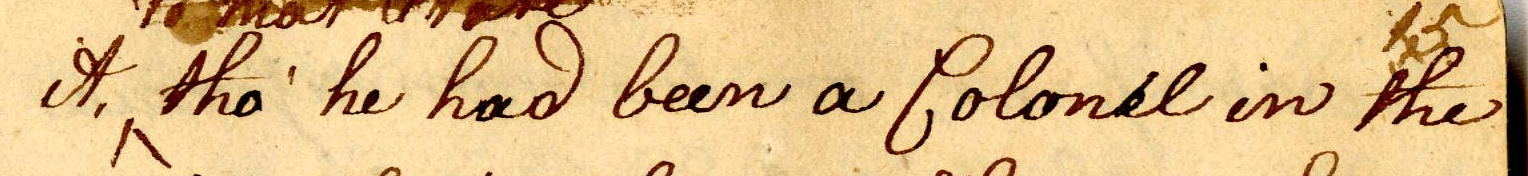it, ^ tho' he had been a Colonel in the ^15
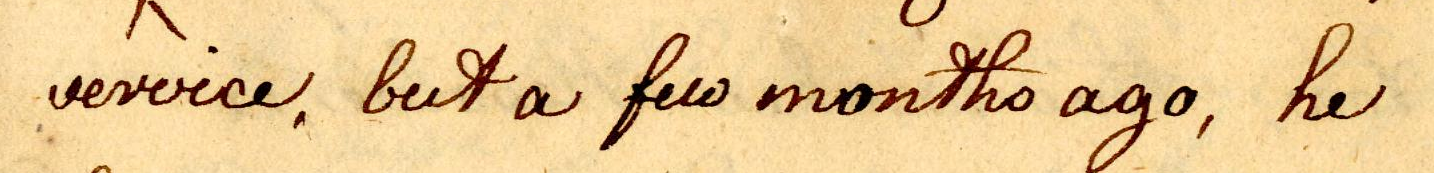service, but a few months ago, he
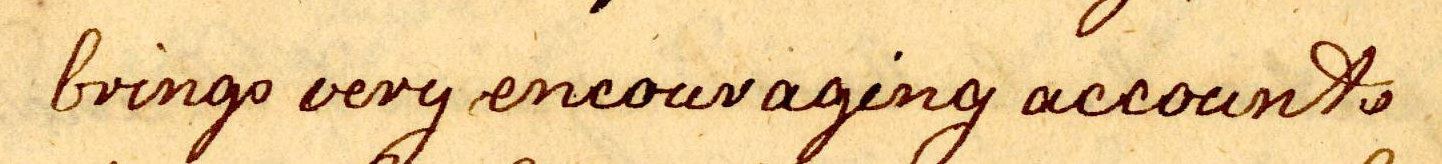brings very encouraging accounts
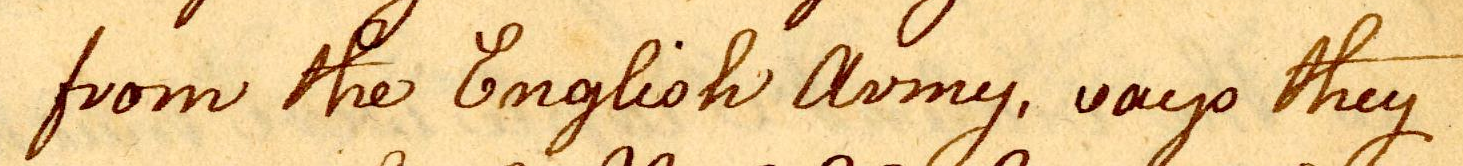from the English Army, says they
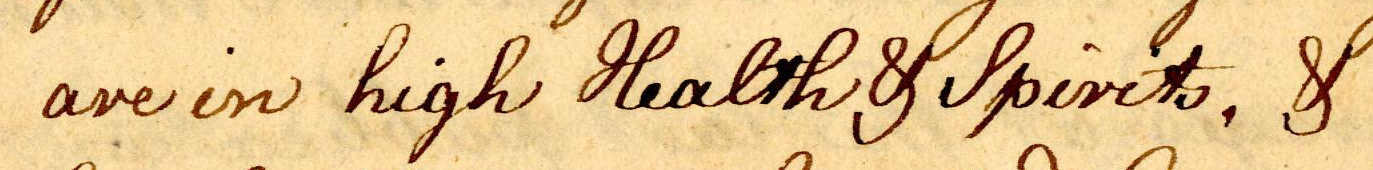are in high Health & Spirits, &
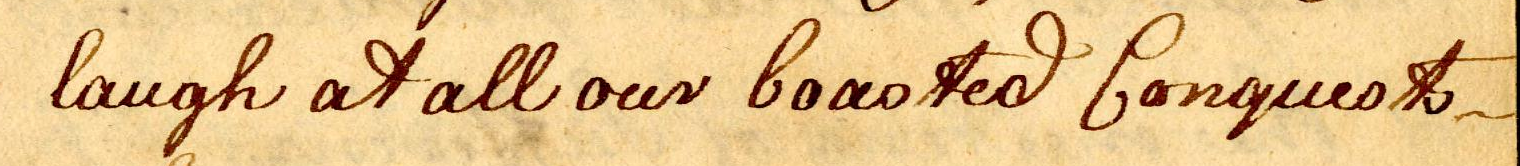laugh at all our boasted Conquests
